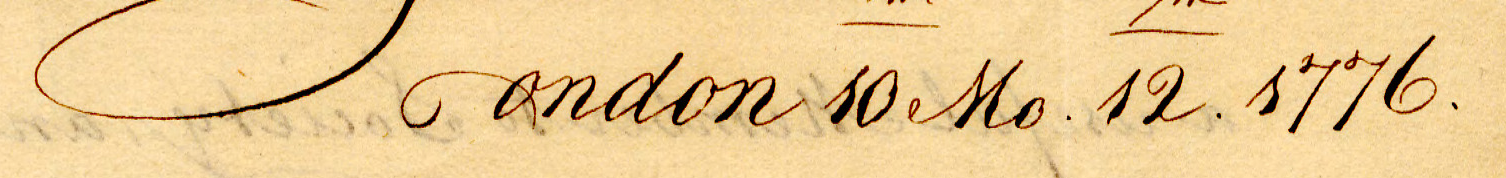London 10^th Mo. 12^th. 1776.
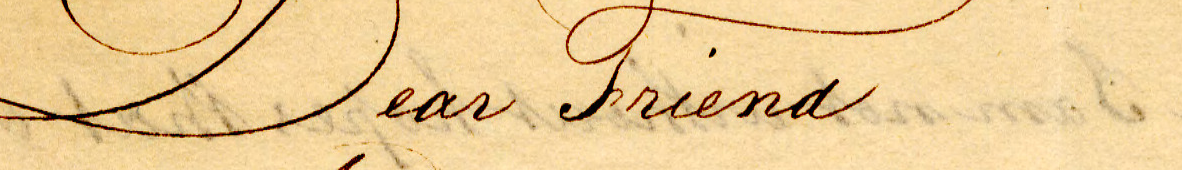Dear Friend
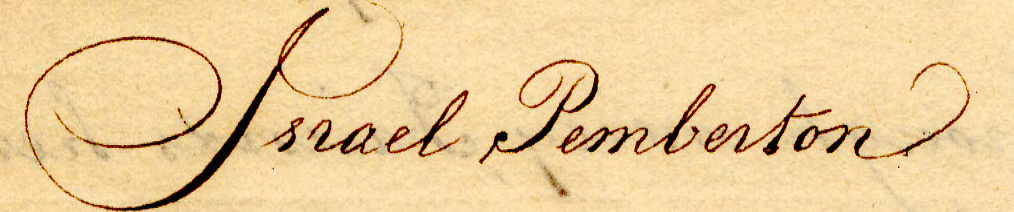Israel Pemberton
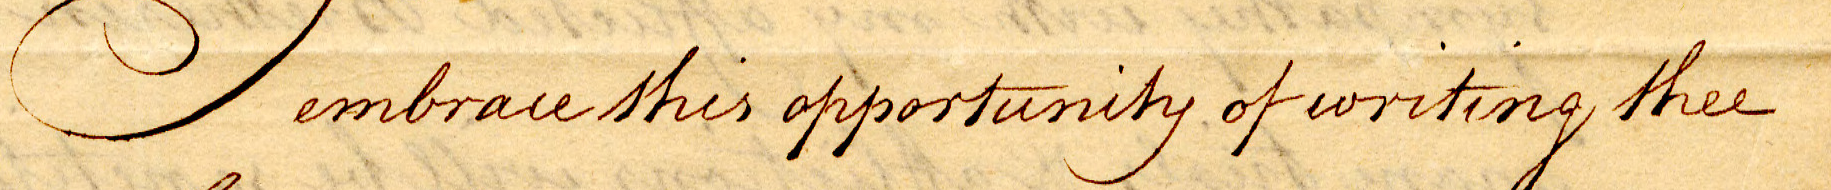I embrace this opportunity of writing thee
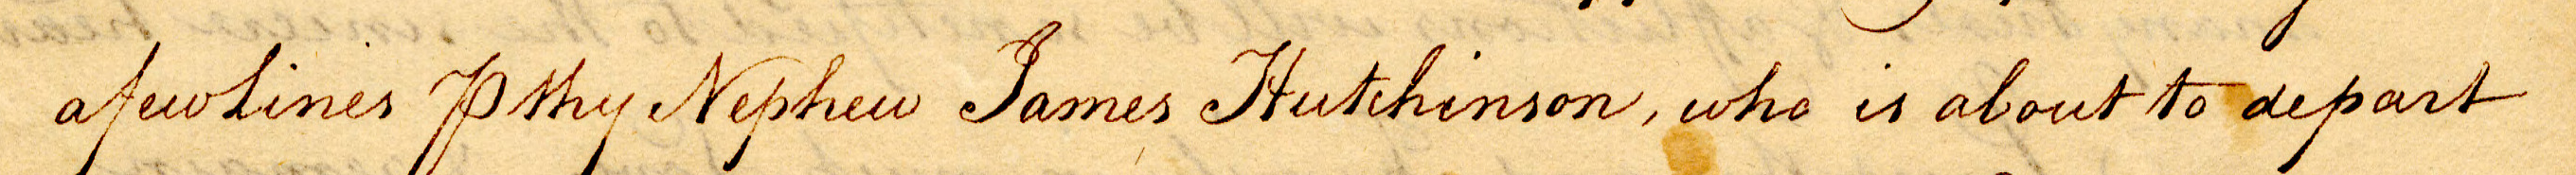a few Lines per thy Nephew James Hutchinson, who is about to depart
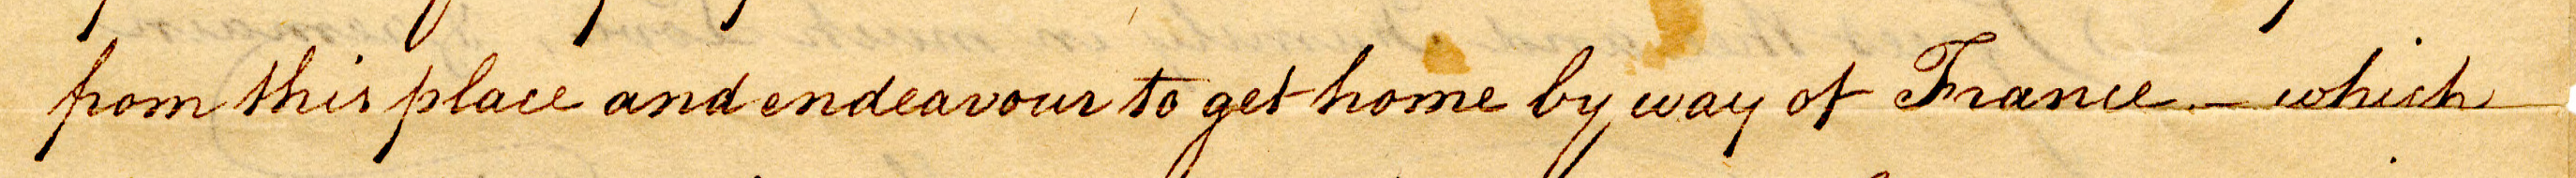from this place and endeavour to get home by way of France- which
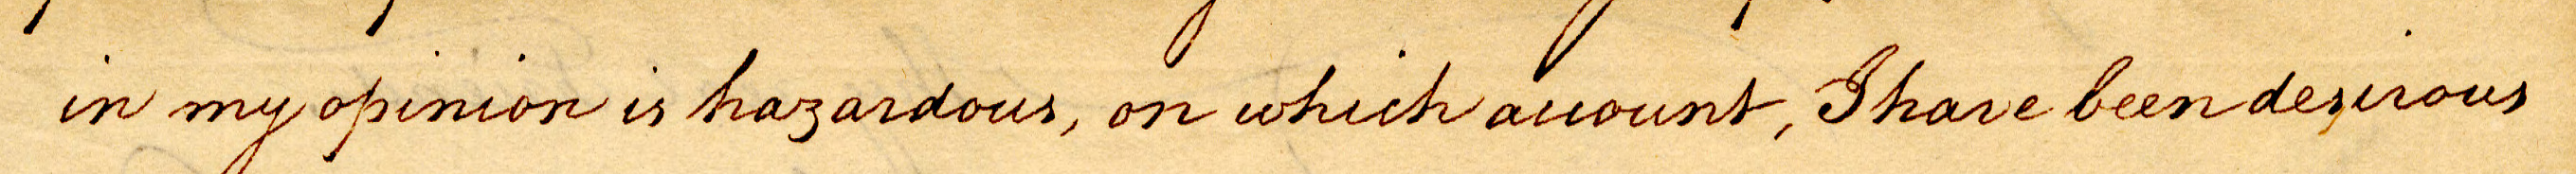in my opinion is hazardous, on which account, I have been desirous
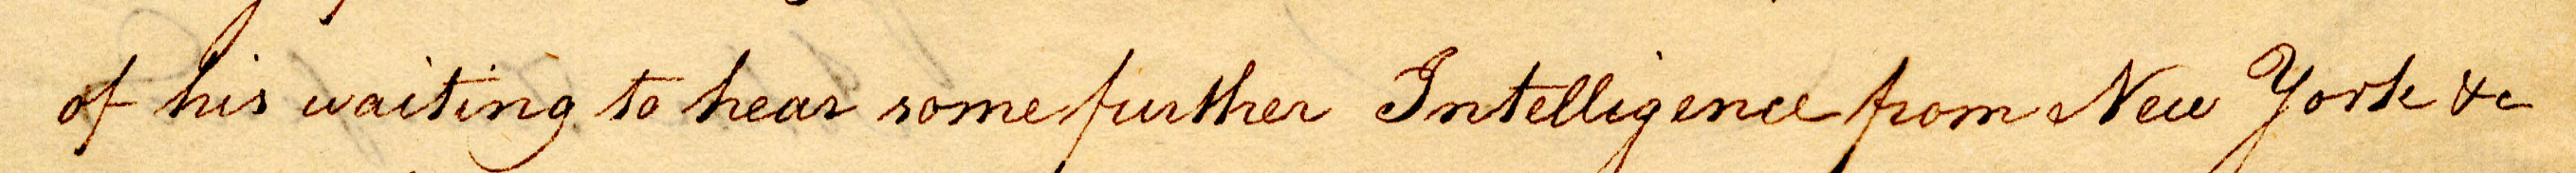of his waiting to hear some further Intelligence from New York &c.
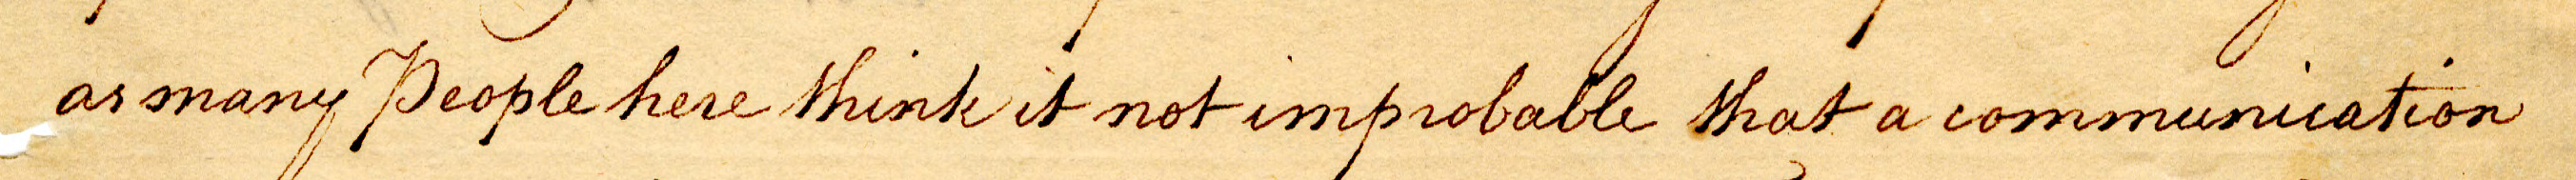as many People here think it not improbable that a communication
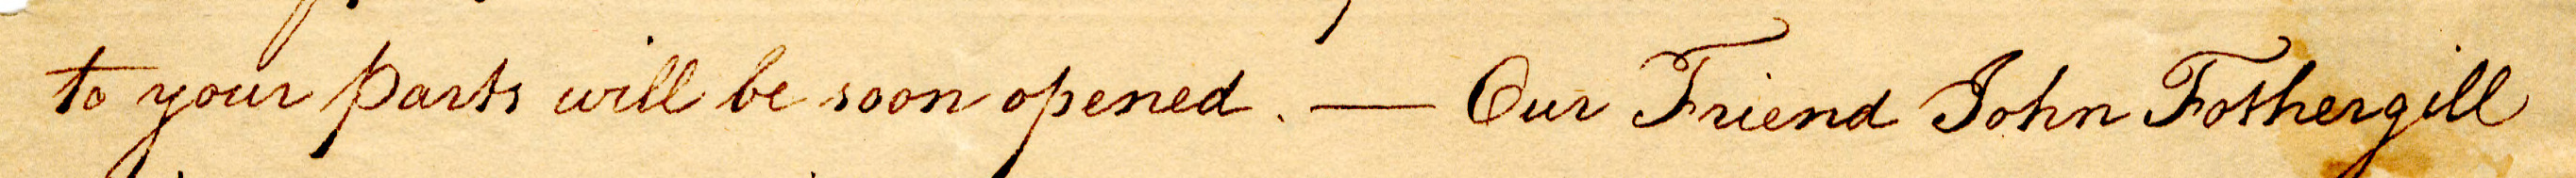to your Parts will be soon opened.- Our Friend John Fothergill
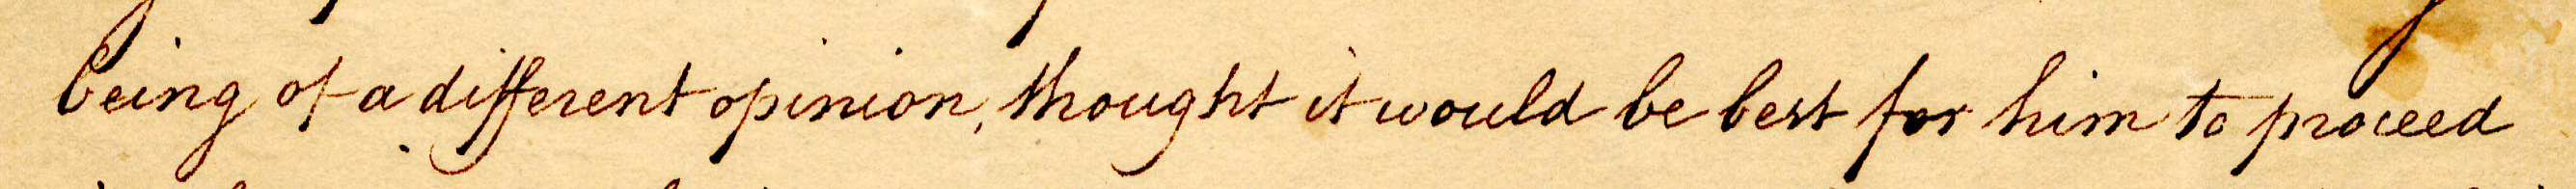being of a different opinion, thought it would be best for him to proceed
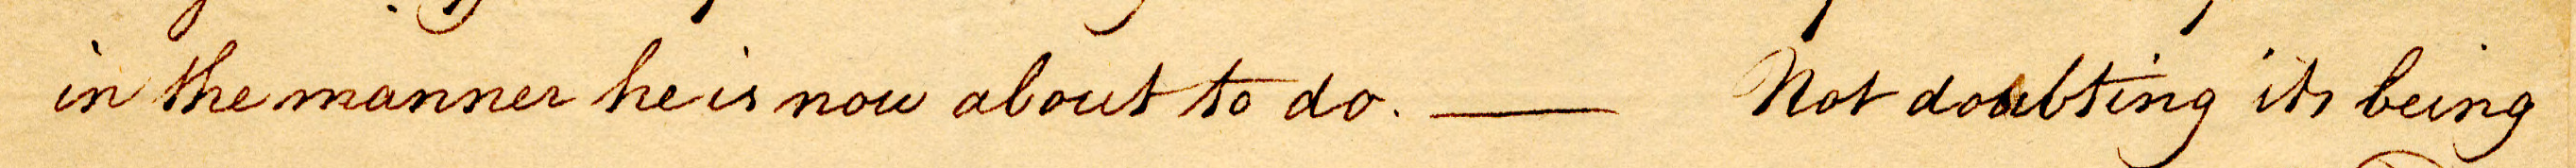in the manner he is now about to do.- Not doubting its being
